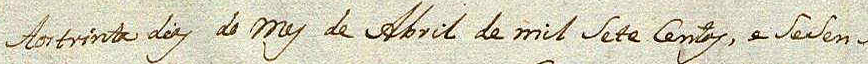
Aos trinta dias do mes de Abril de mil seteCentos, e sesen
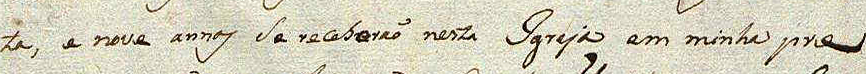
ta, e nove annos se receberaõ nesta Igreja em minha pre
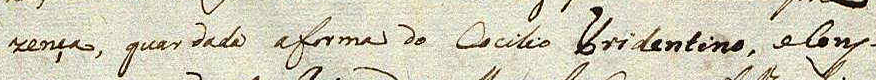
zença, guardada a forma do Cocilio Tridentino, e Cons
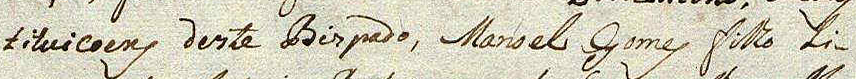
tituiçoens deste Bispado, Manoel Gomes filho Li
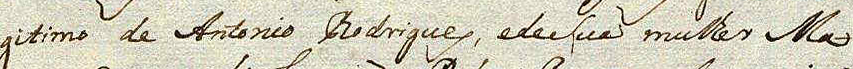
gitimo de Antonio Rodrigues, e de Sua mulher Ma
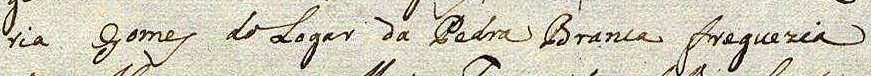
ria Gomes do Logar da Pedra Branca freguezia
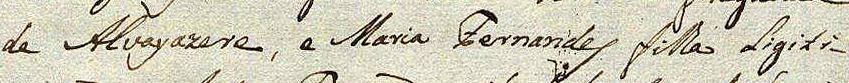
de Alvayazere, e Maria Fernandes filha Ligiti
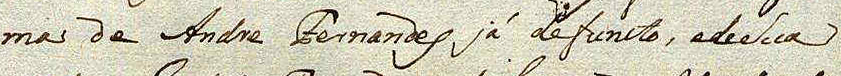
mas de Andre Fernandes já defuncto, e de Sua
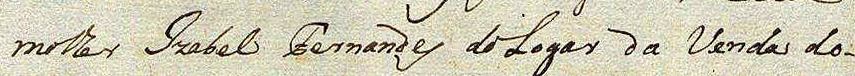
molher Izabel Fernandes do Logar da Venda do
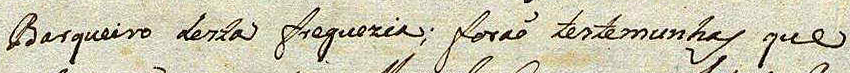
Barqueiro desta freguezia; foraõ testemunhas que
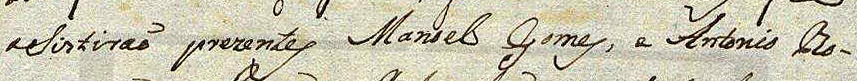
aSistiraõ prezentes Manoel Gomes, e Antonio Ro
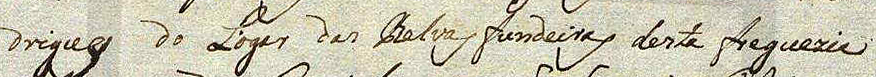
drigues do Logar das Relvas fundeiras desta freguezia
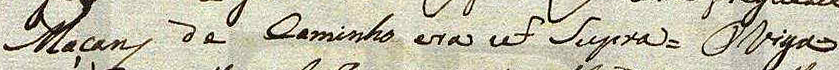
Maçans de Caminho era ut Supra = O Viga
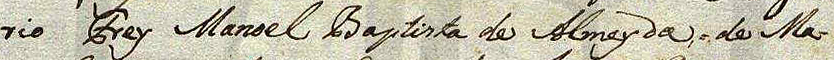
rio Frey Manoel Baptista de Almeyda, de Ma
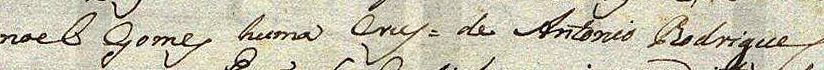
noel Gomes huma Crus= de Antonio Rodrigues
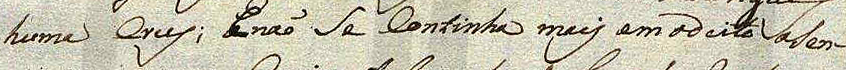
huma Crus; E naõ se Continha mais em o deito asen
